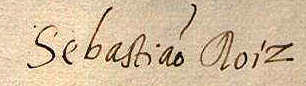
Sebastião Roiz
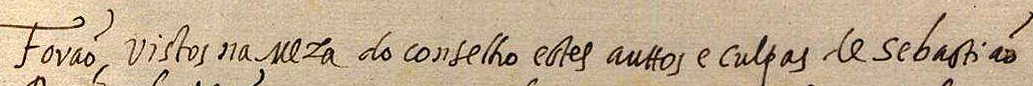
Foraõ vistos na Meza do conselho estes auttos e culpas de sebastiaõ
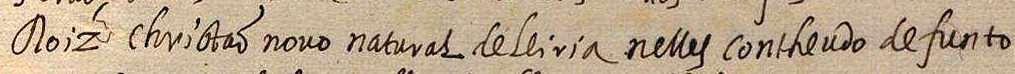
Roiz̄ christaõ nouo natural de Leiria nelles contheudo defunto
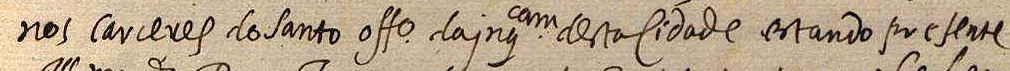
nos carceres do santo offo. da jnqcam. desta Cidade estando presente
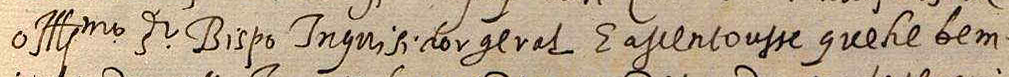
o Illsmo. sor. Bispo Inquisidor geral E assentousse que he bem
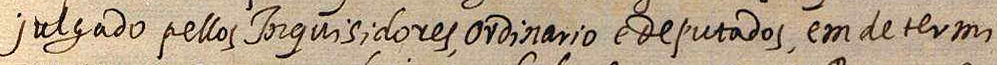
julgado pellos Inquisidores, ordinario e deputados, em determi
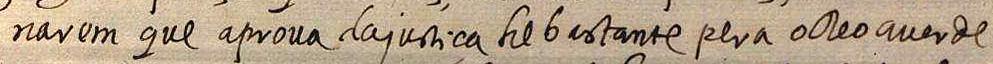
narem que a proua da justiça he bastante pera o Reo auer de
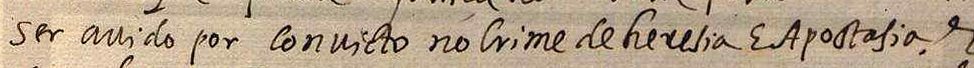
ser auido por conuicto no Crime de heresia E Apostasia. E
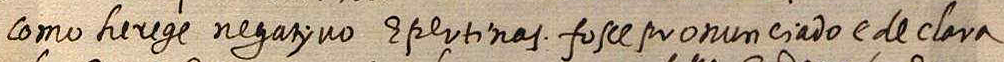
como herege negatyuo E pertinas fosse pronunciado e declara
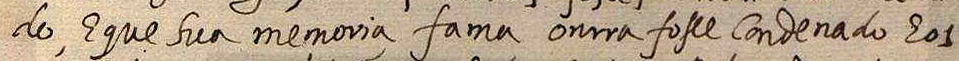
do, E que sua memoria, fama, onrra fosse condenado E os
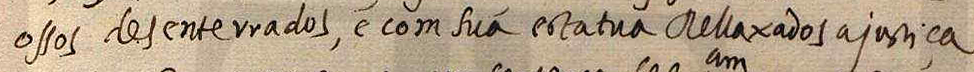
ossos desenterrados, e com sua estatua Rellaxados a justiça
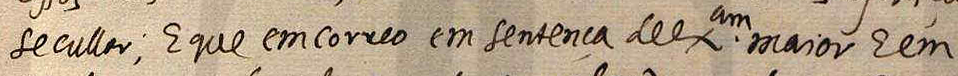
secullar, E que emcorreo em sentença de exam. maior E em
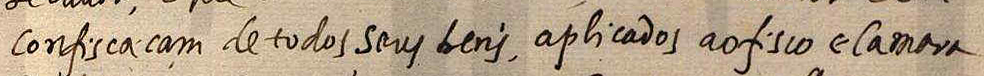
confiscaçam de todos seus bens, aplicados ao fisco e Camara
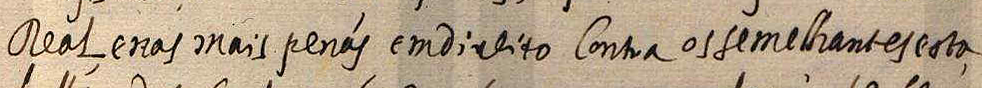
Real, e nas mais penas em direito Contra os semelhantes esta
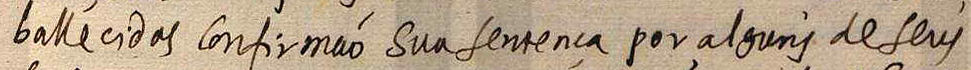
ballecidas confirmaõ sua sentença por alguns de seus
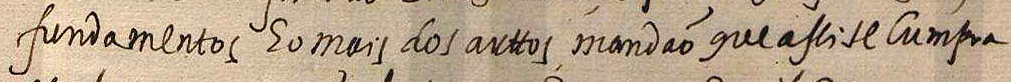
fundamentos E o mais dos auttos mandaõ que assi se Cumpra
